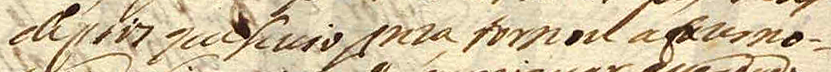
depois que se uio preza, tornou a fazer no
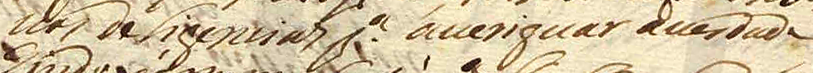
uas deligencias p.a aueriguar a uerdade
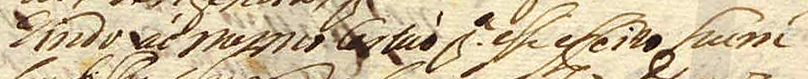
hindo ao mesmo certaõ p.a esse effeito hum̄
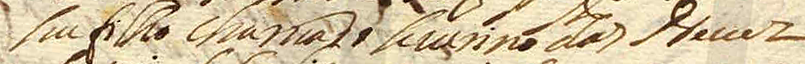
seu filho chamado Seuerino das Neuez
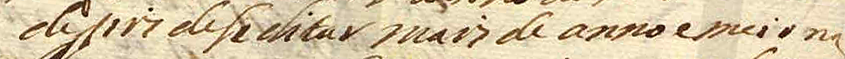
depois de se ditar mais de anno e meio na
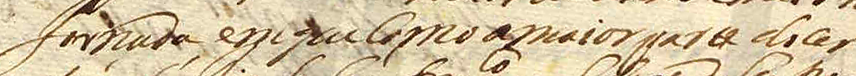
Jornada, em que como a maior parte do cer
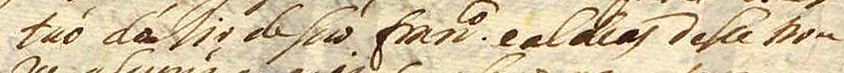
taõ dahi de sao fran.co e aldeas desse trou
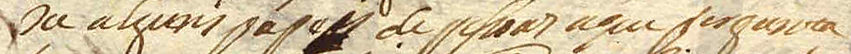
xe alguns̄ papeis de pessoas a que pergunta
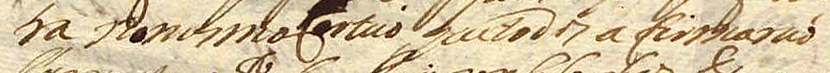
ra no mesmo Certaõ, que todos afirmaraõ
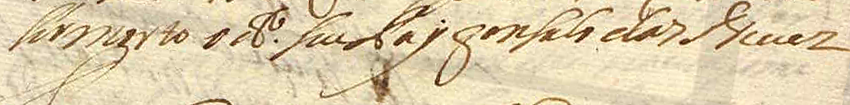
ser morto o d.o seu Pay gonsalo das Neuez
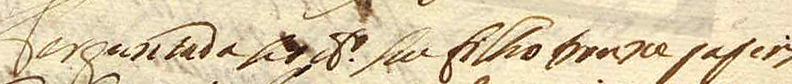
Perguntada se o d.o seo filho trouxe papeis
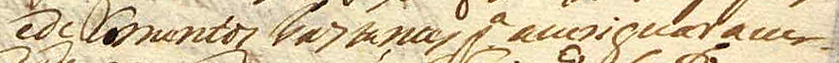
e de Comentos bastantes p.a aueriguar a uer
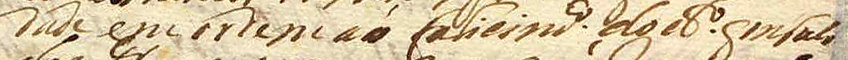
dade em ordem ao falicim.to do d.o gonsalo
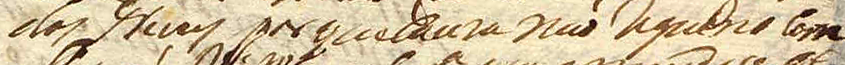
das Neues por que cauza naõ requereo com
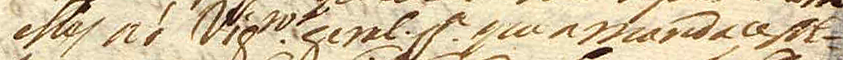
elles ao Vigro. geral pa. que a mandace sol
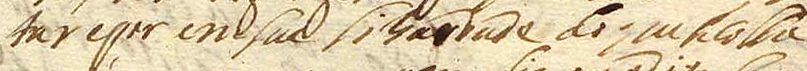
tar e por em sua liberdade do que se colhe
